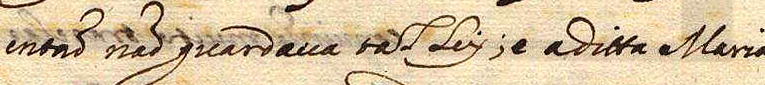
entaõ naõ guardava tal Ley; e a ditta Maria
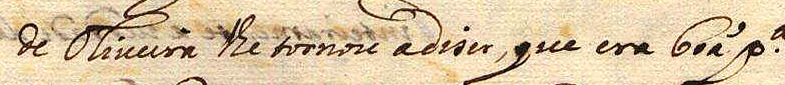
de Oliveira lhe tornou a diser, que era boa p.a
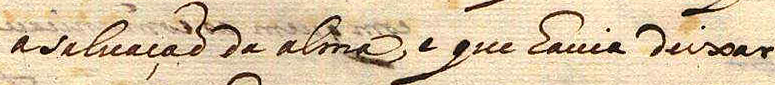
a salvaçaõ da alma, e que havia deixar
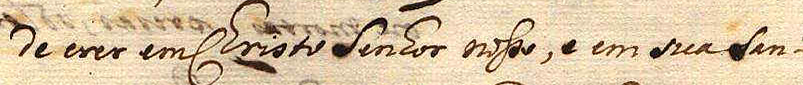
de crer em Christo Senhor nosso, e em sua San
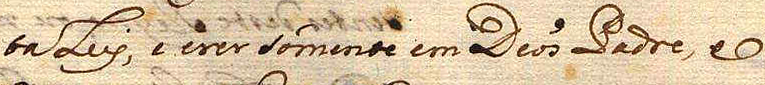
ta Lei, e crer sōmente em Deos Padre, e
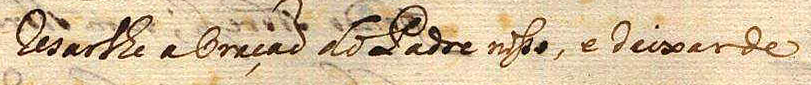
Resar lhe a Oraçaõ do Padre nosso e deixar de
